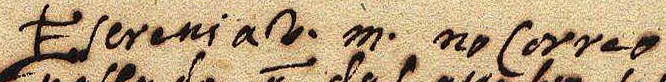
Escreui a v. m. no Correo
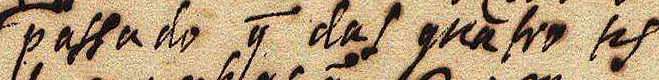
passado q̄ das quatro tes
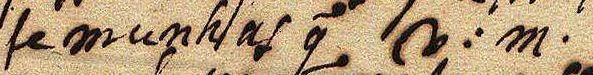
temunhas q̄ v: m.
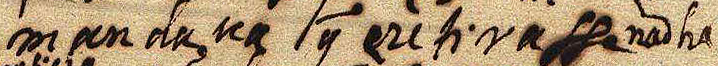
mandaua q̄ eu tirasse não ha
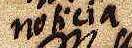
noticia
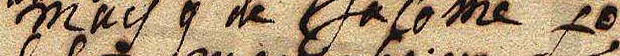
mais q̄ de Jacome fo
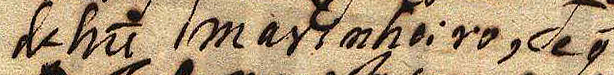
de hu̅ marinheiro, e q̄
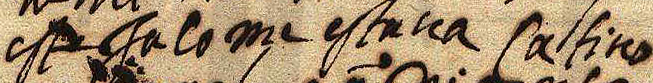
este Jacome estaua Catiuo
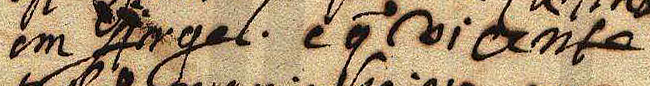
em Arrgel. e q̄ vicente
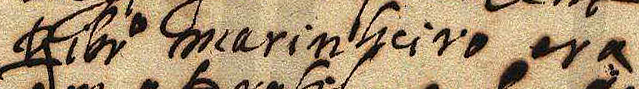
Ribro marinheiro era
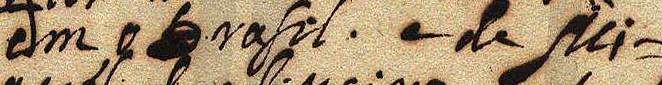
em o brasil. e de Mi
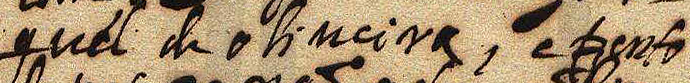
guél de oliueira, e bento
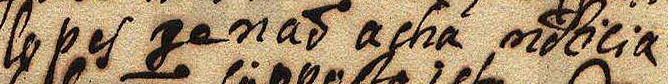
lopes se naõ acha noticia
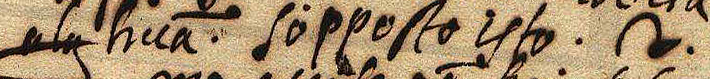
alghuā. sopposto isto. v.
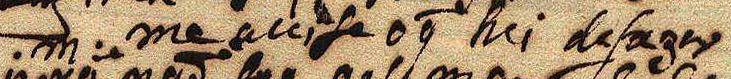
.m. me auise o q̄ hei de fazer
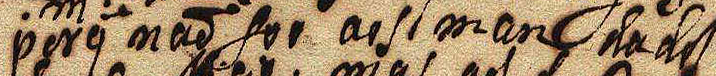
porq̄ naõ foi assi mandado
